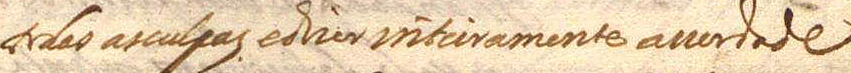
todas as culpas e dizer inteiramente a uerdade
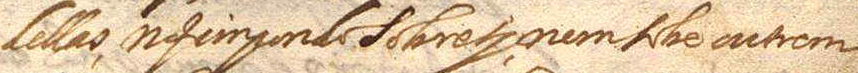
dellas, naõ impondo sobre sj, nem sobe outrem
